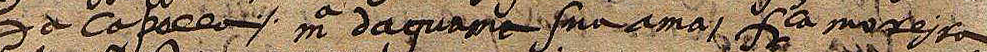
da capella ./. ma da guama sua ama / frca morejra
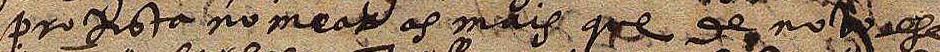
E protesta nomear as mais que de novo lhe
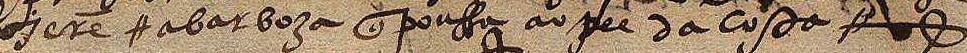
vjerē item a barboza q̄ poussa ao pee da costa item
